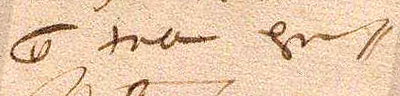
q̄ tall he //
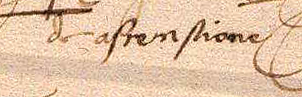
de ascensione
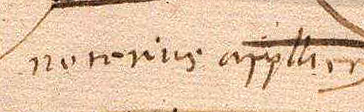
notarius app̄llicꝯ
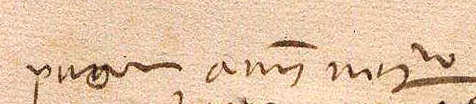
pagou a mj̄ notro
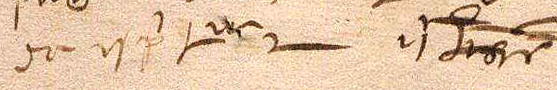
da espitra – ijc r̄s rs̄
